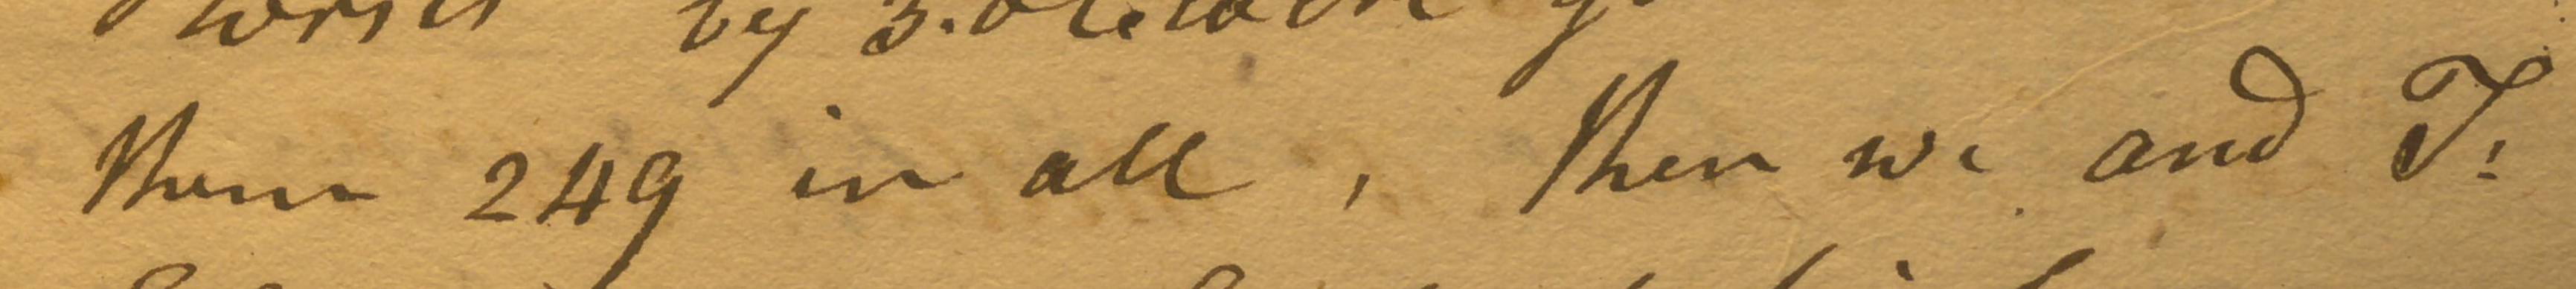them 249 in all, then we and T:
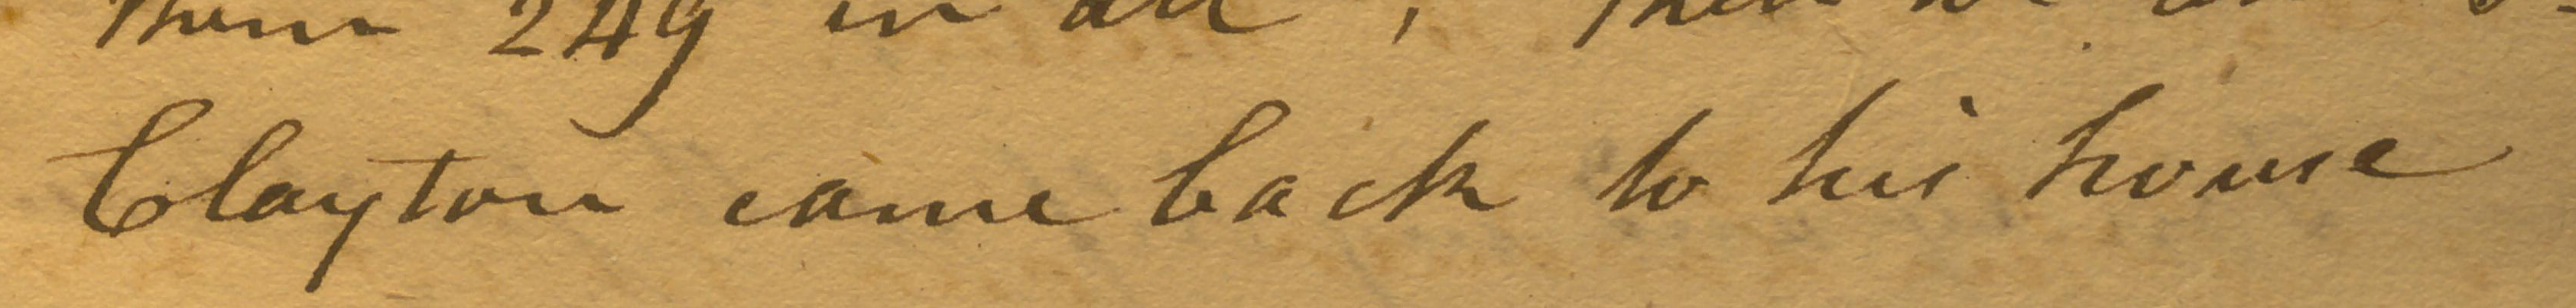Clayton came back to his house
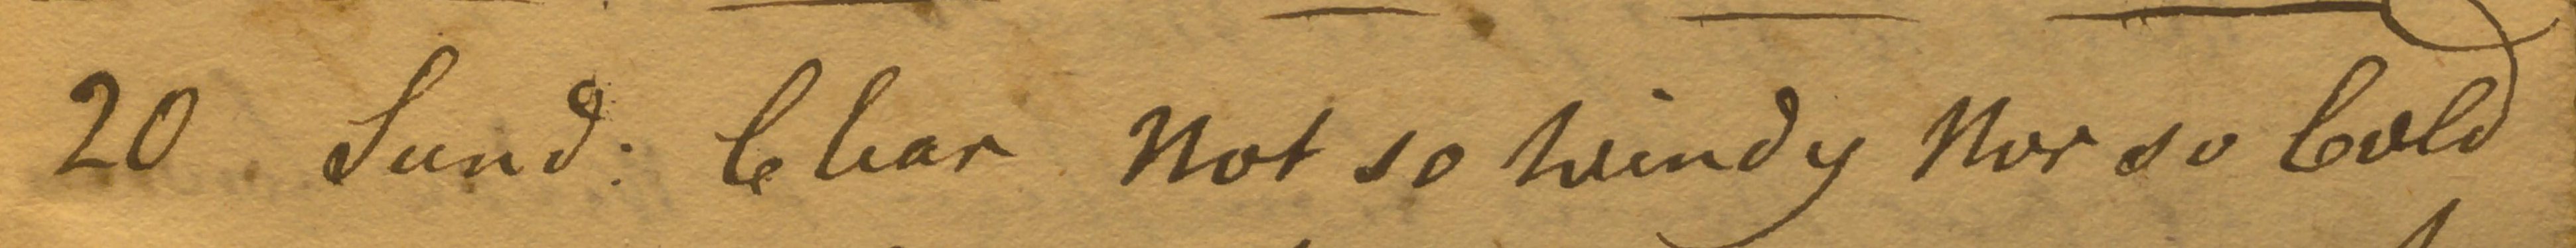20 Sund. Clear Not so tindy Nor so Cold
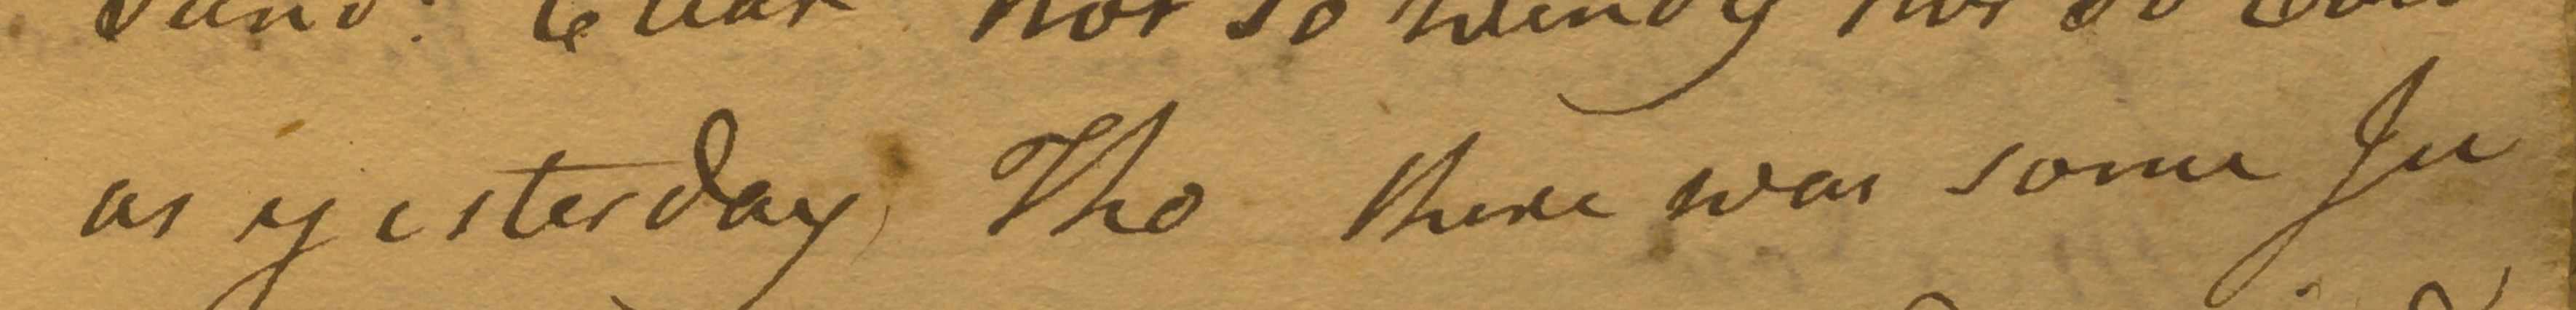as yesterday, Tho there was some Ice
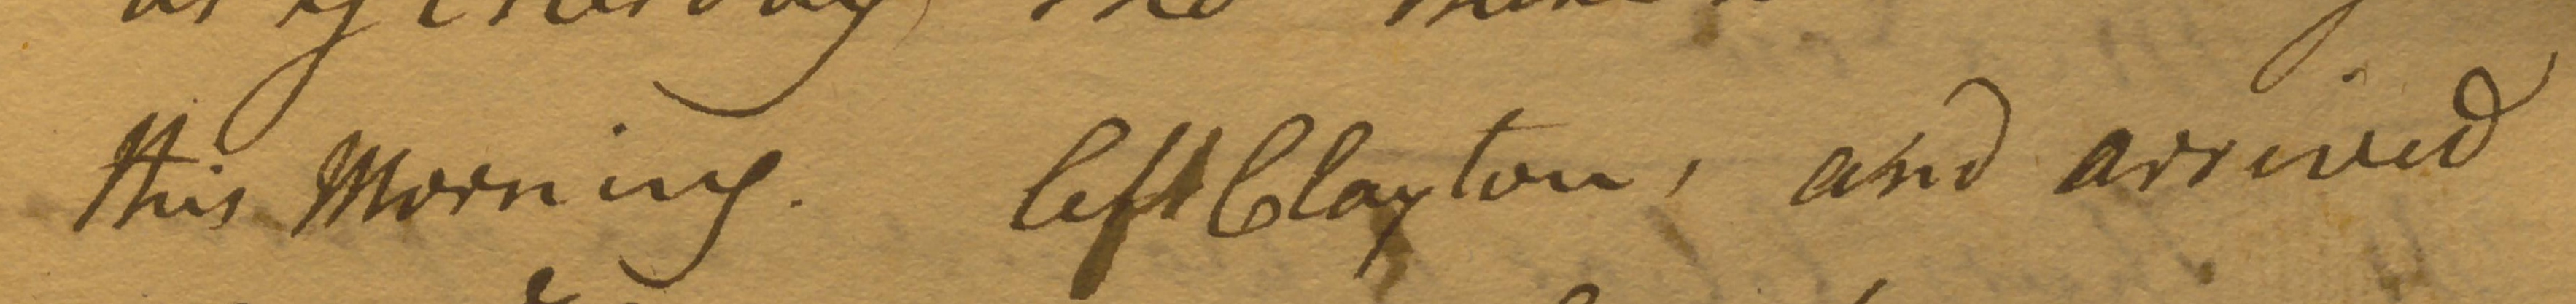this Morning. left Clayton, and arrived
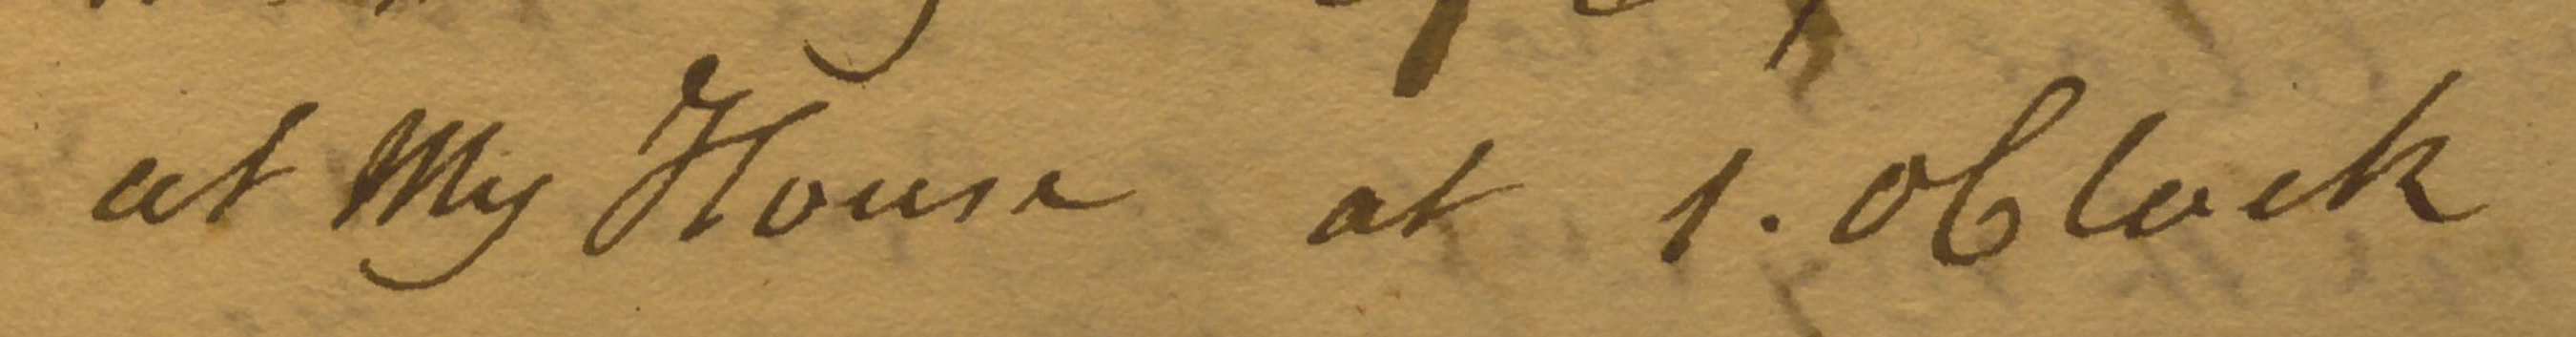at My House at 1. oClock
